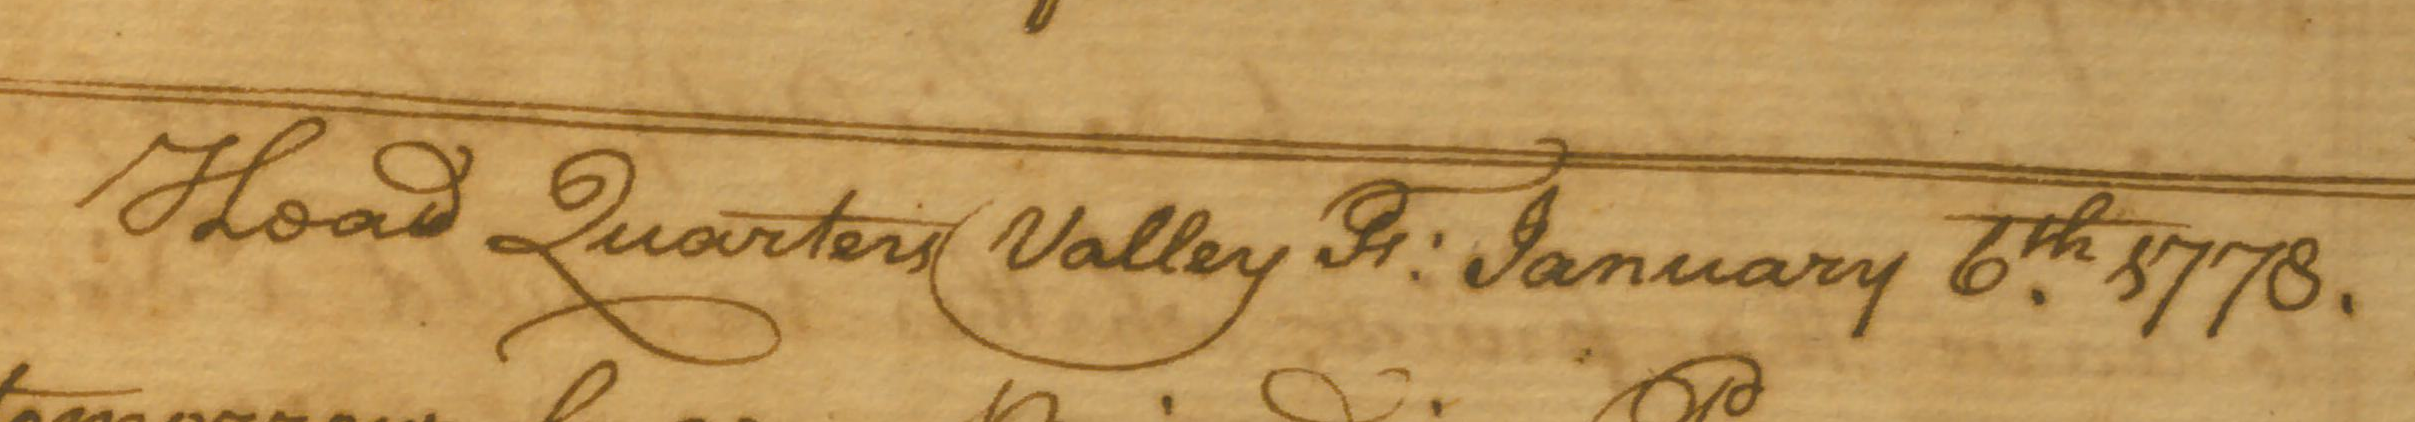Head Quarters Vally F: January 6^th. 1778.
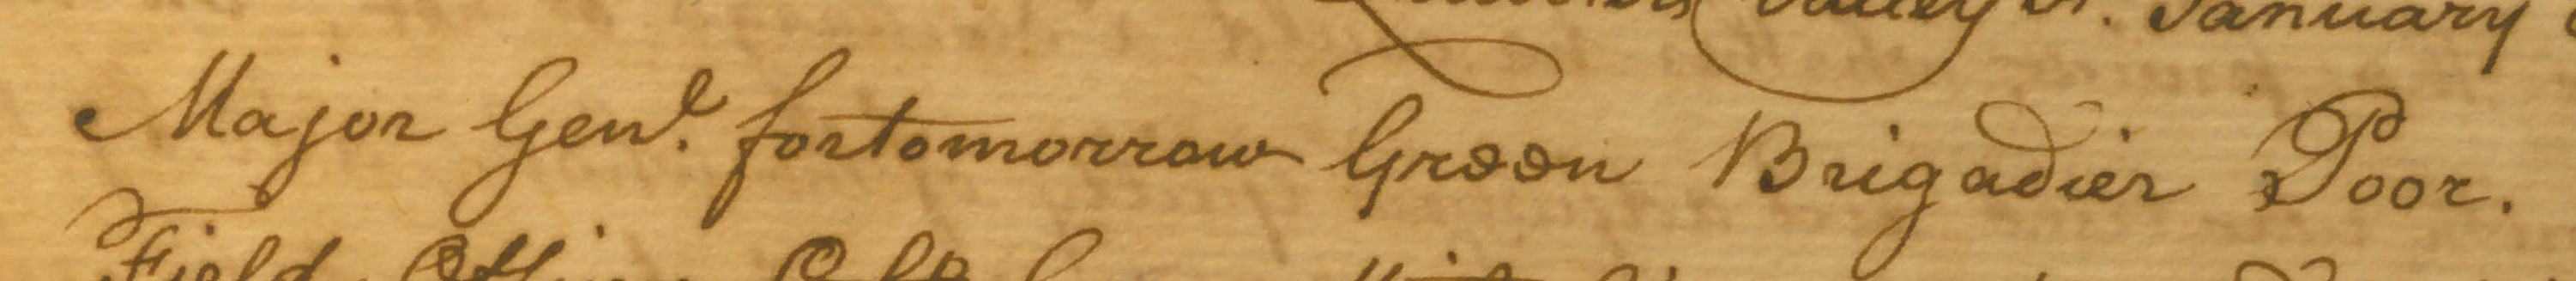Major Gen^l. for tomorrow Green Brigadier Poor.
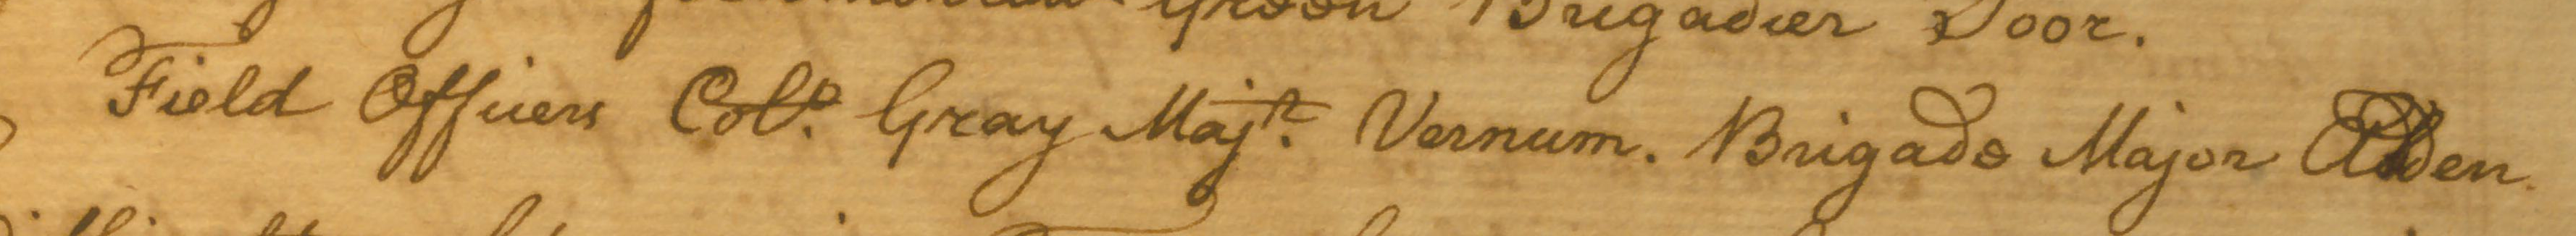Field Officers Col^o. Gray Maj^r. Vernum. Brigade Major Alden.
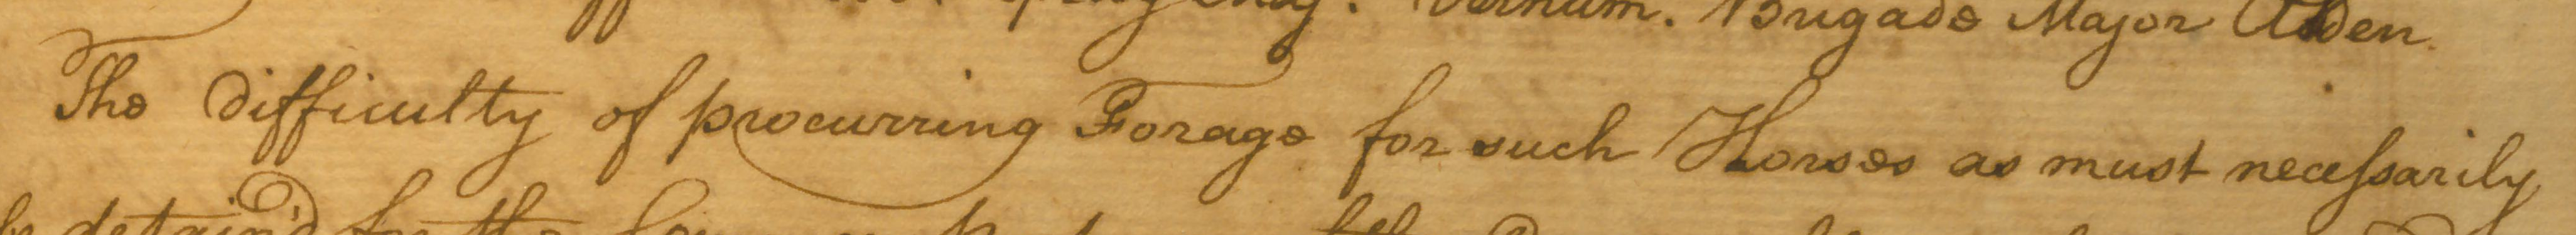The difficulty of procurring Forage for such Horses a must necessarily
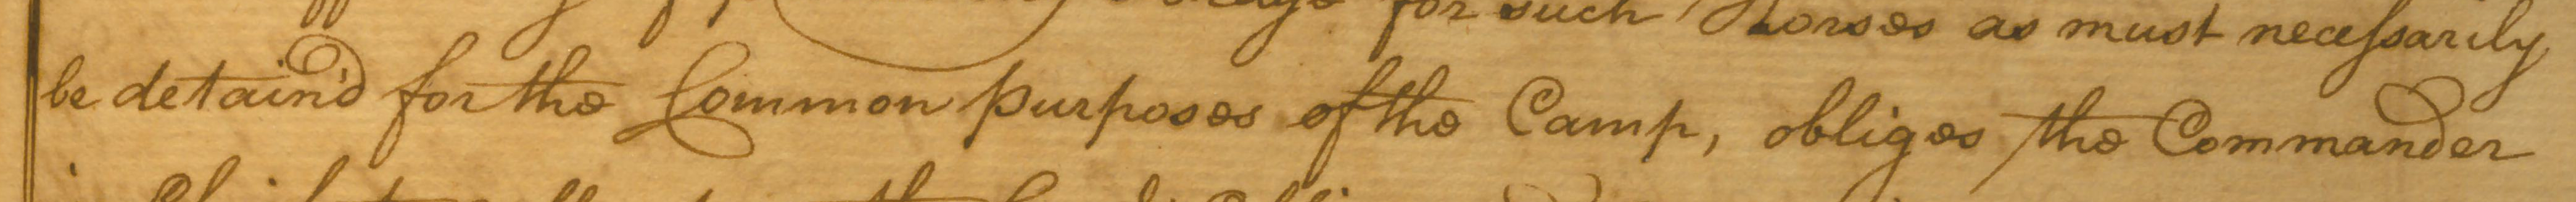be detain'd for the Common purposes of the Camp, obliges the Commander
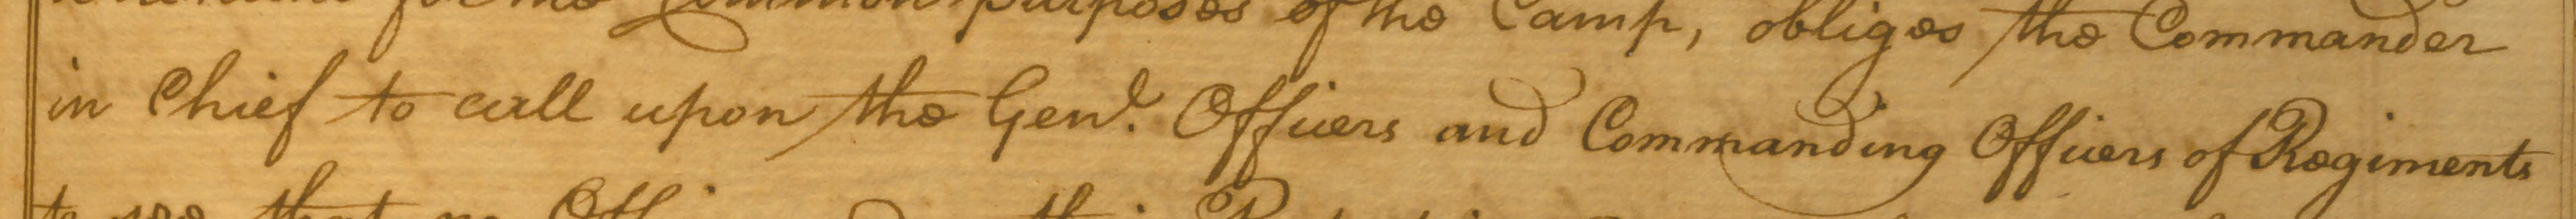in Chief to call upon the Gen^l. Officers and Commanding Officers of Regiments
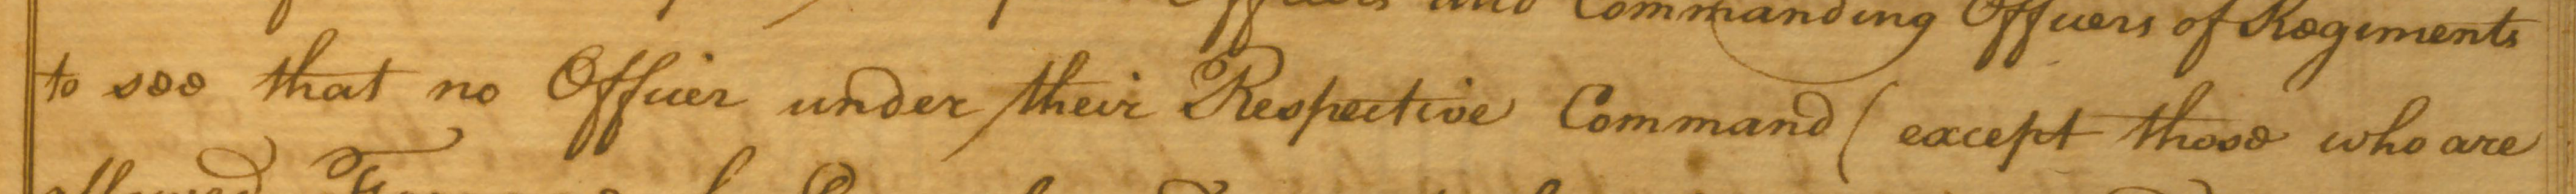to see that no Officer under their Respective Command (except those who are
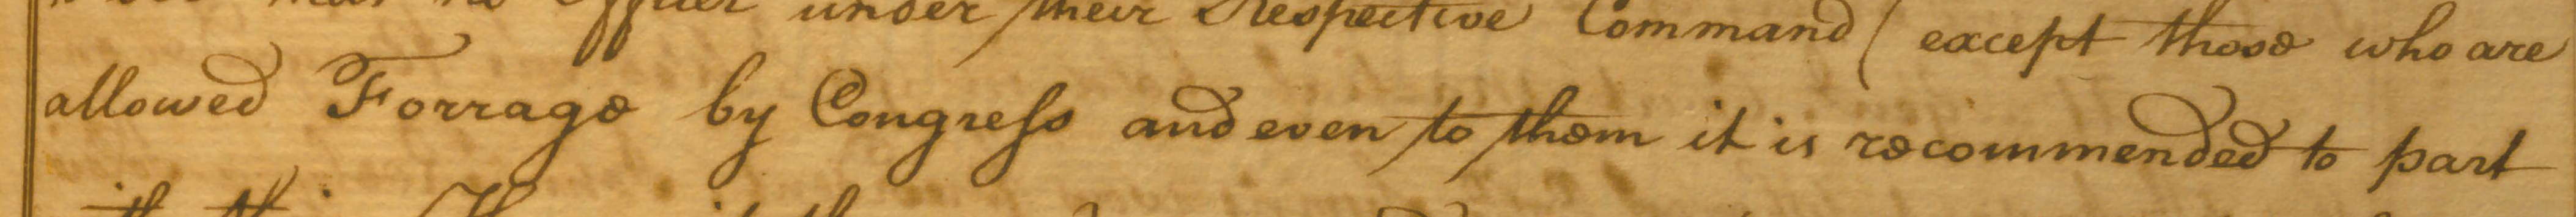allowed Forrage by Congress and even to them itis recommended to part
